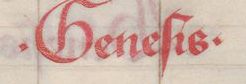.Geneſis.
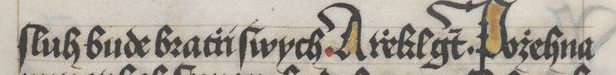ſluh bude bratṙí ſwych.A ṙekl ḡt.Pożehna¬
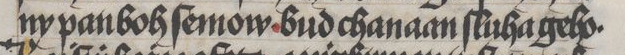ny pan boh ſemow.bud chanaan ſluha geho.
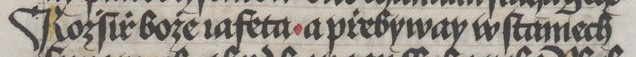Rozẛiṙ boże iafeta.a pṙebyway w ſtaniech
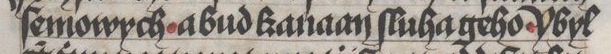ſemowych.a bud kanaan ſluha geho.Ybyl¬
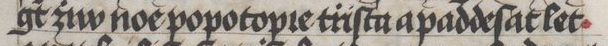ḡt żiw noe popotopie tṙiſta a paddeſat let.
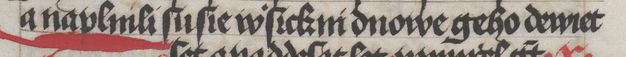a naplnili ſu ſie wẛickni dnowe geho dewiet¬
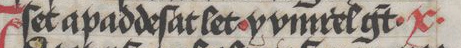ſet a paddeſat let.y vmṙel ḡt.x.
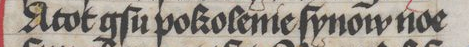A tot gſu pokoleníe ſynow noe
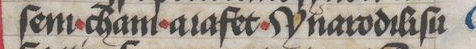ſem.cham.a iafet.Y narodili ſu
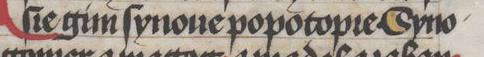ſie gím ſynoue popotopie.Syno¬
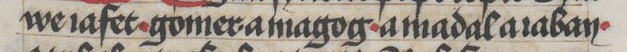we iafet.gomer.a magog.a madal a iaban.
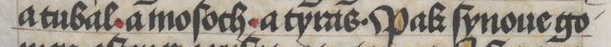a tubal.a moſoch.a tyras.Pak ſynoue go¬
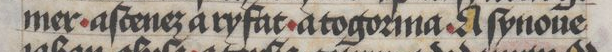mer.aſtenez a ryfat.a togorma.A ſynoue
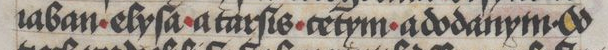iaban.elyſa.a tarſis.cetym.a dodanym.Od
